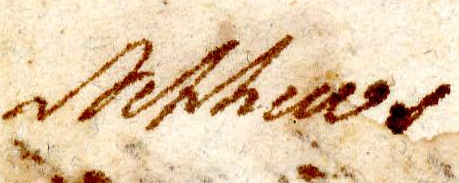Nephews
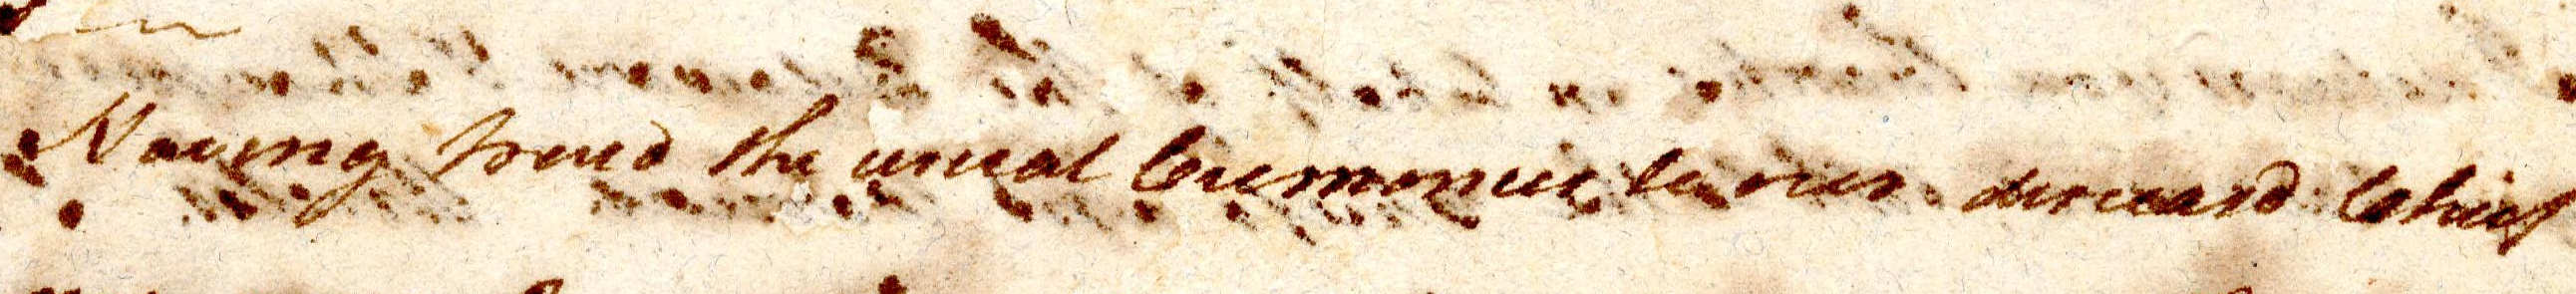Having paid the usual Ceremonies to our deceased Chief
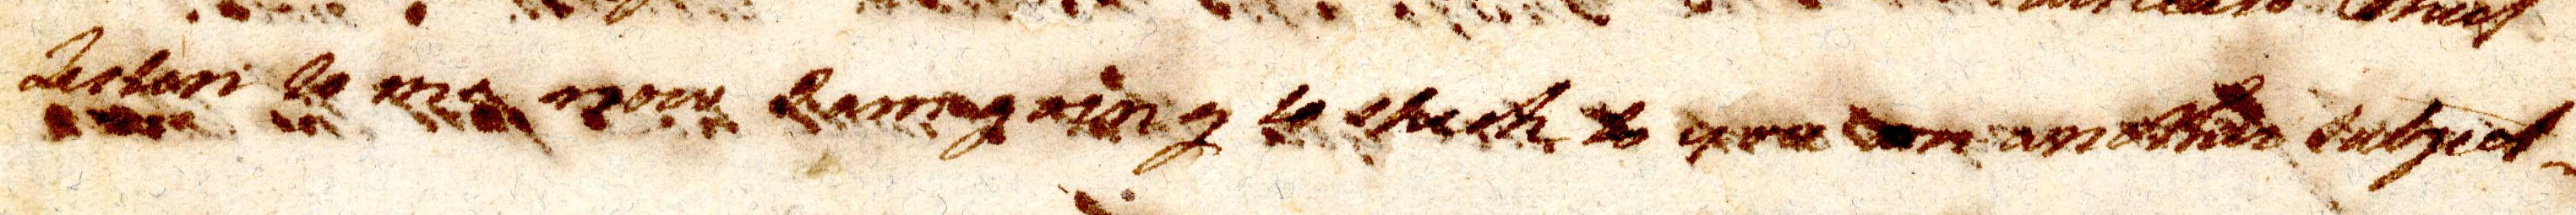Listen to me now I am going to speak to you upon another subject
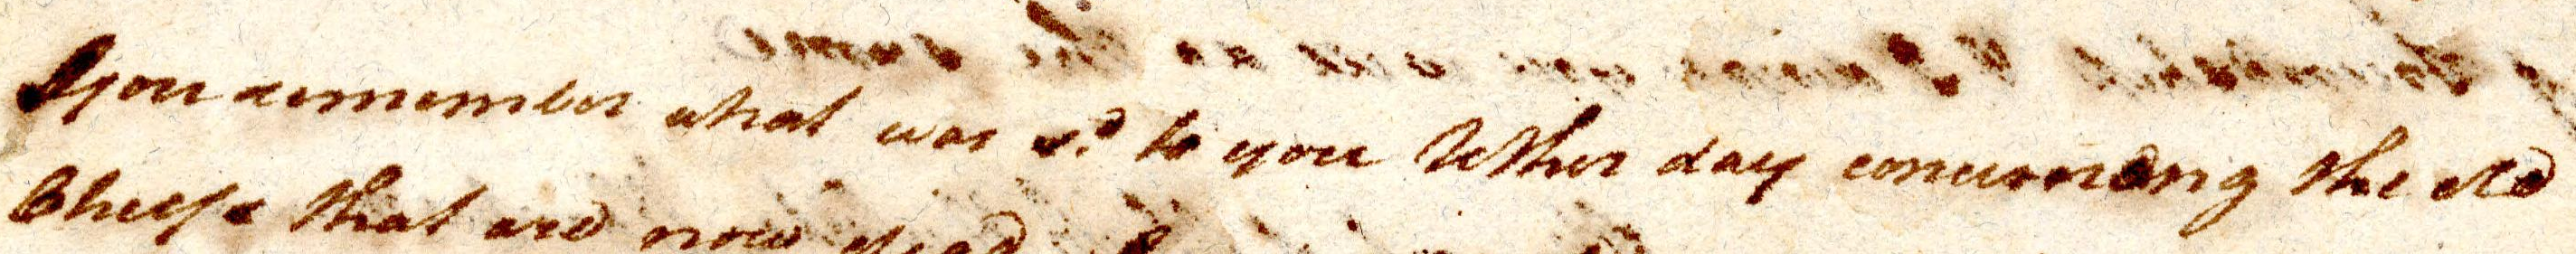You remember what was s^d. to you other day concerning the old
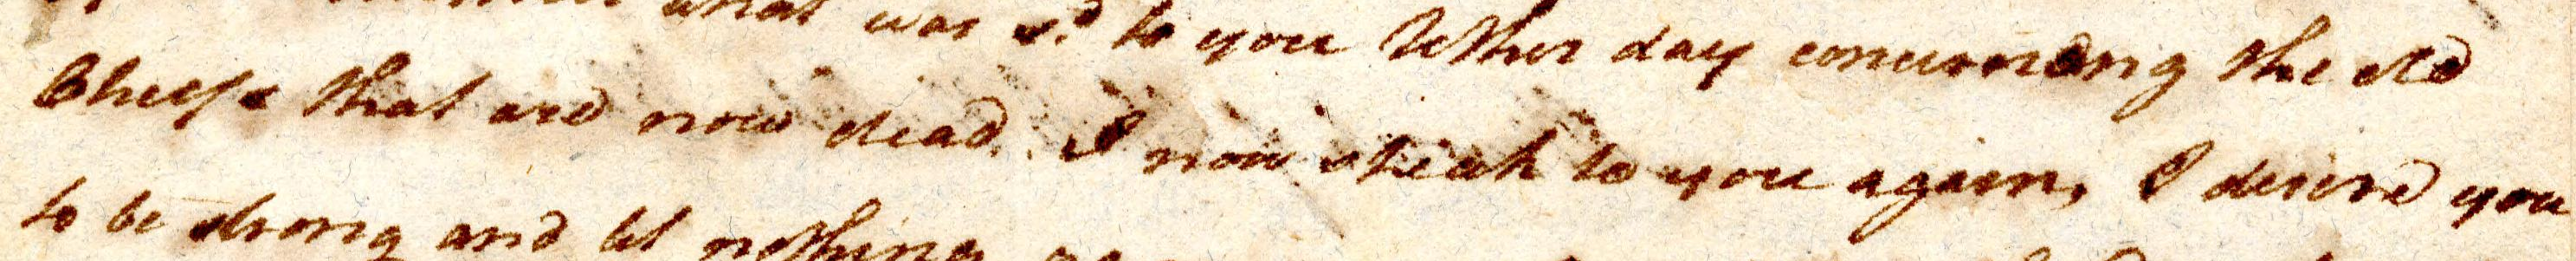Chiefs that are now dead. I now speak to you again, I desire you
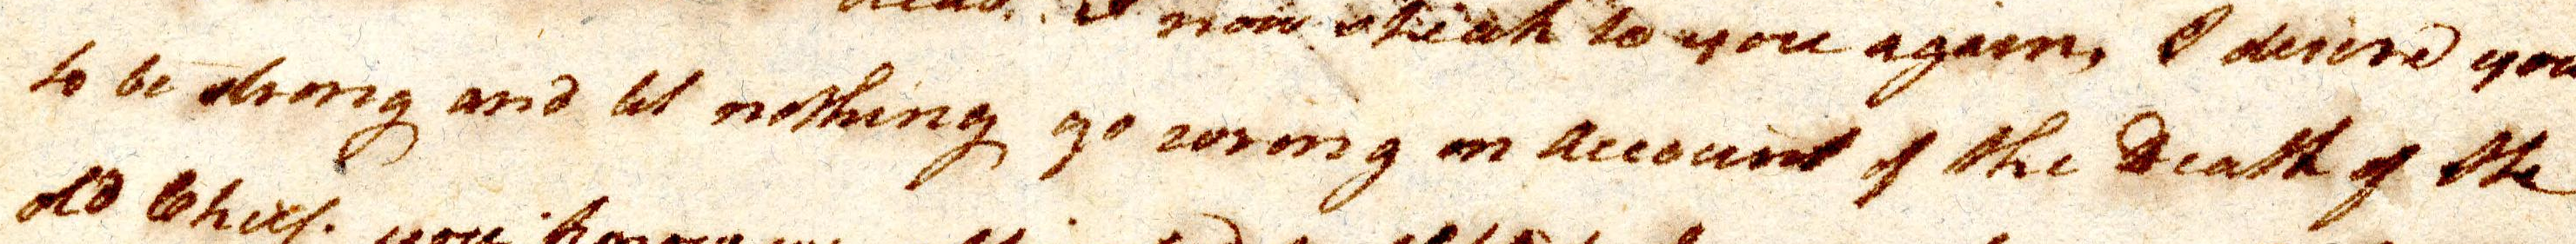to be strong and let nothing go wrong on account of the death of the
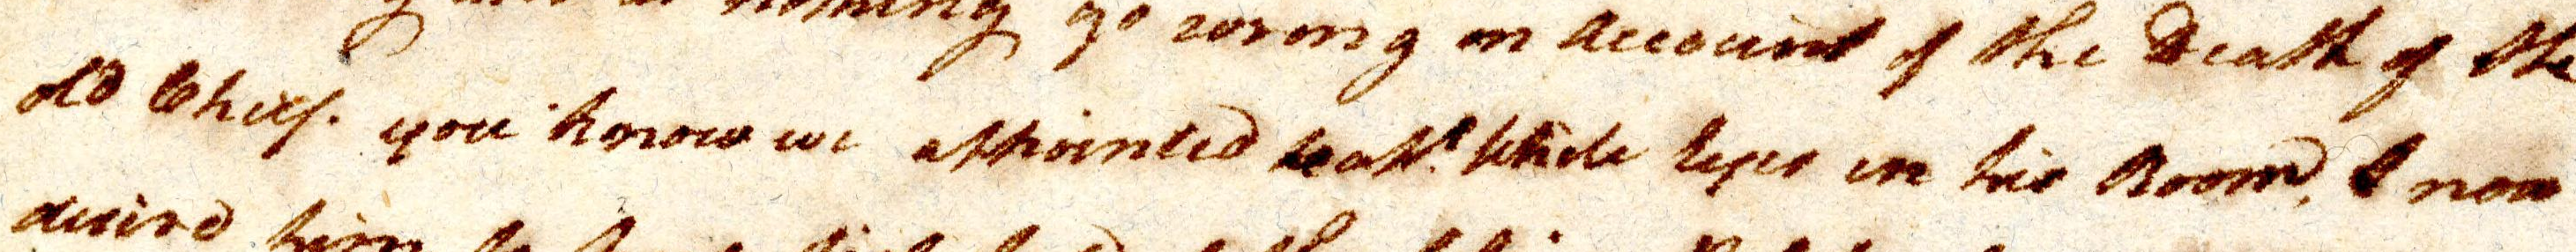old Chief. you know we appointed [___] White Eyes in his Boom, I now
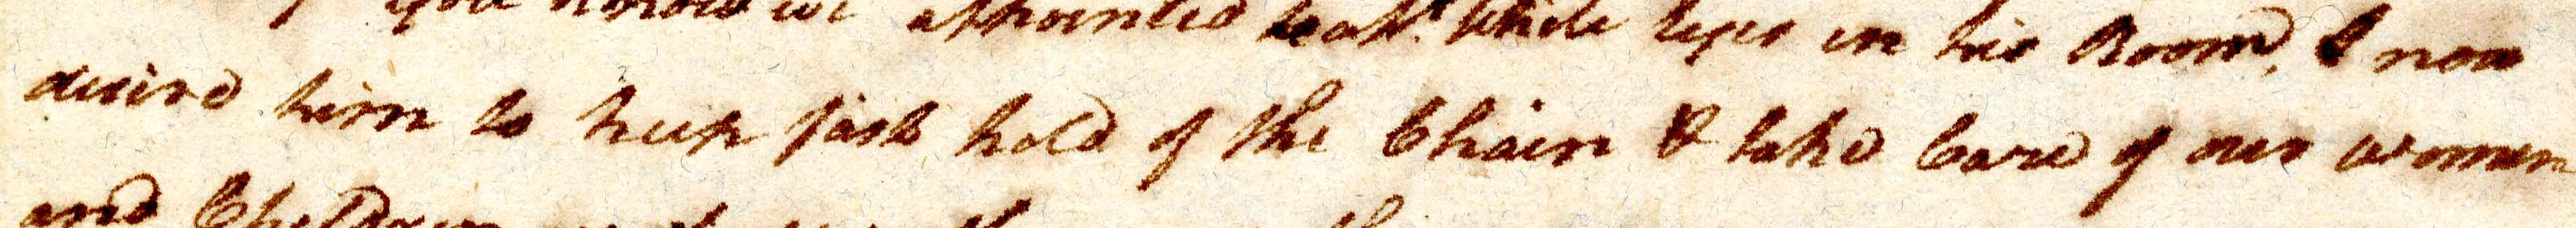desire him to keep fast hold of the Chain & take Care of our women
